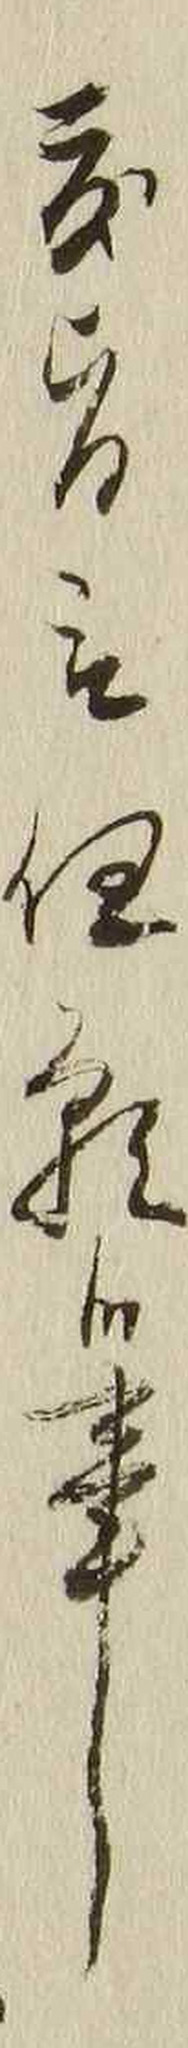度旨被任願候事
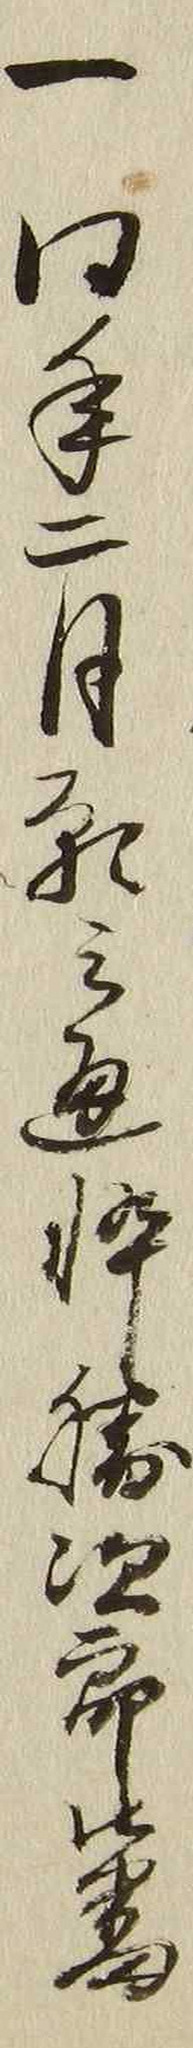一同年二月願之通忰勝次郎御番
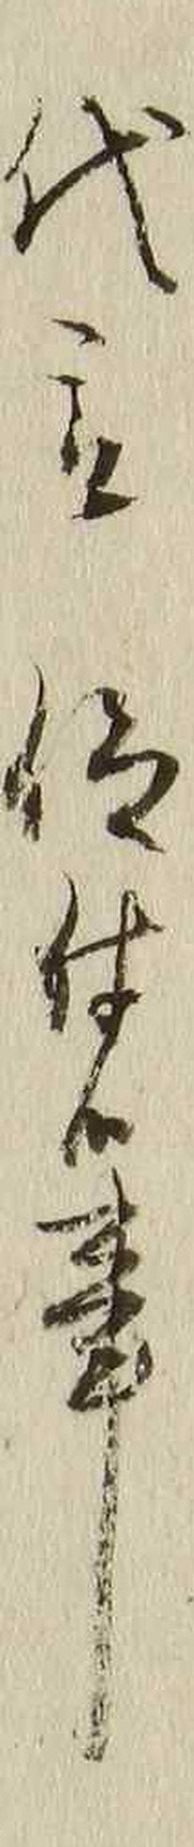代被仰付候事
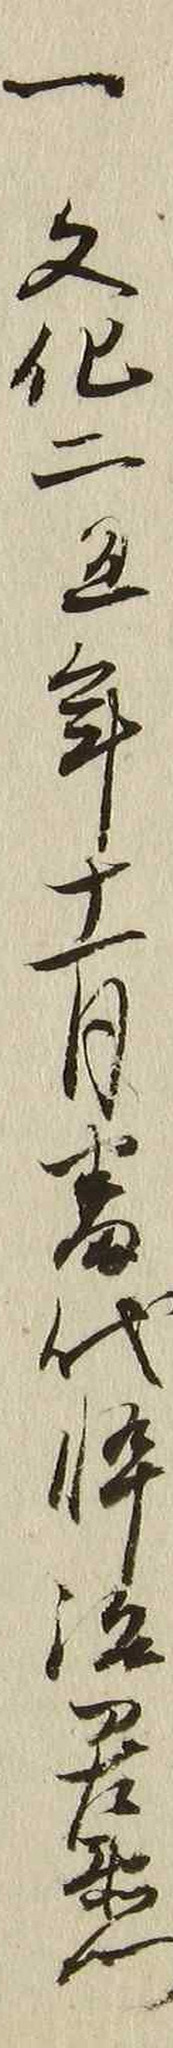一文化二丑年十一月番代忰治部左衛門
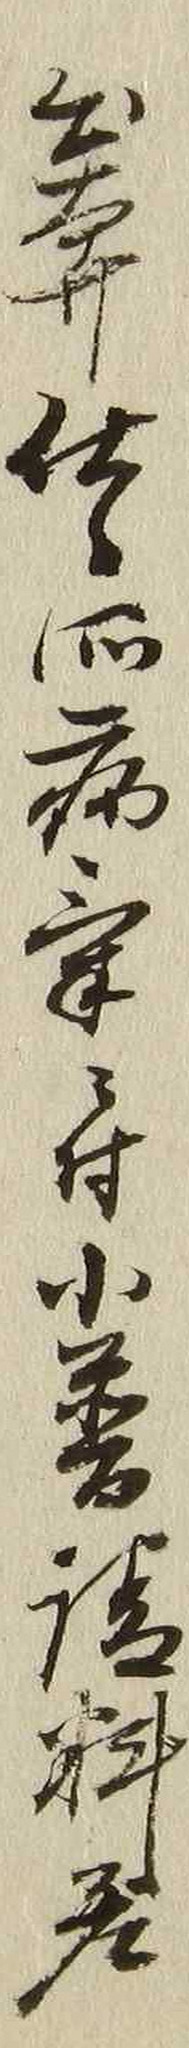出奔仕候所病気ニ付小普請料差
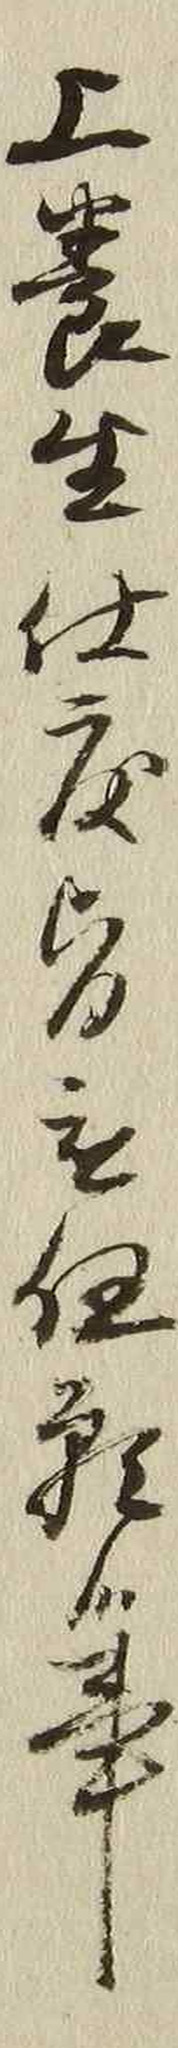上養生仕度旨被任願候事
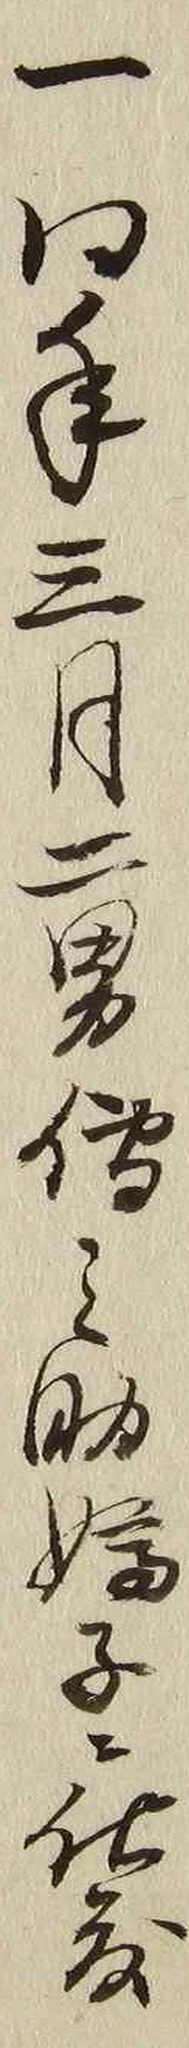一同年三月二男伝之助嫡子ニ仕度
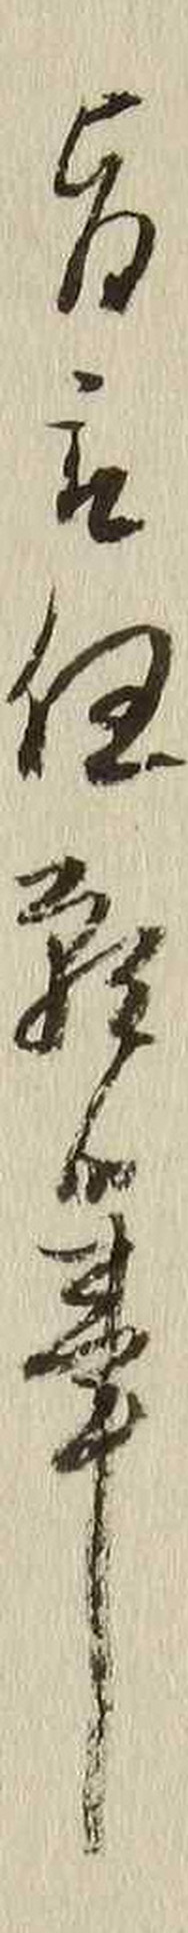旨被任願候事
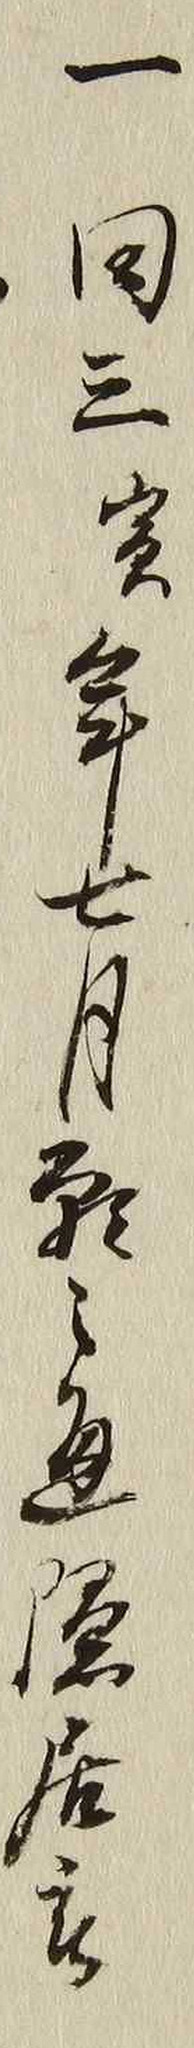一同三寅年七月願之通隠居被
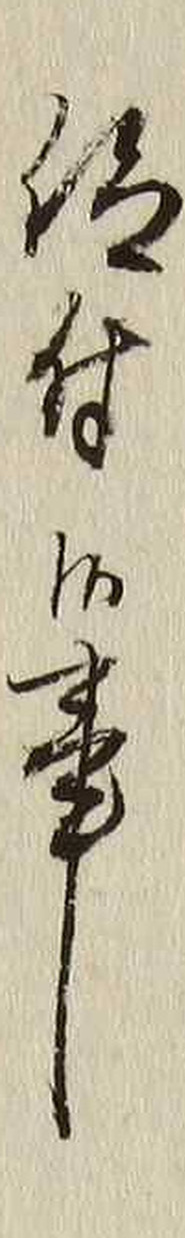仰付候事
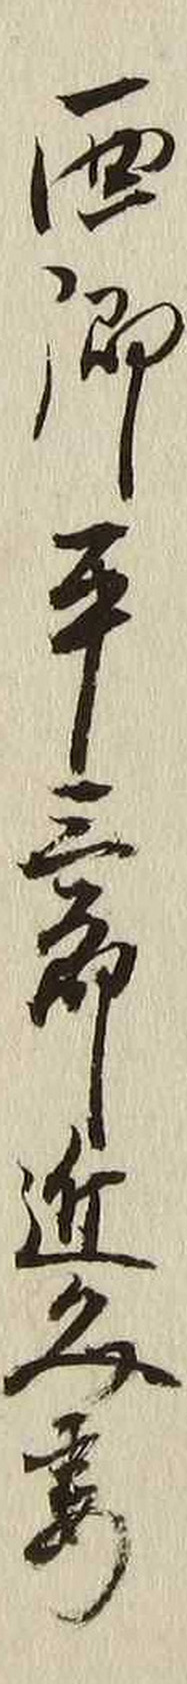女西郷平三郎近久妻
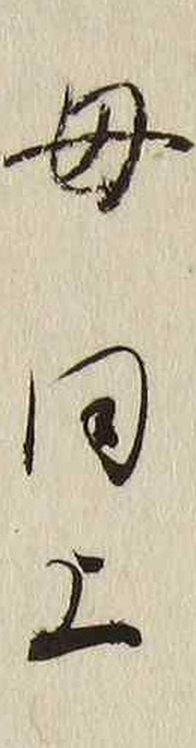母同上
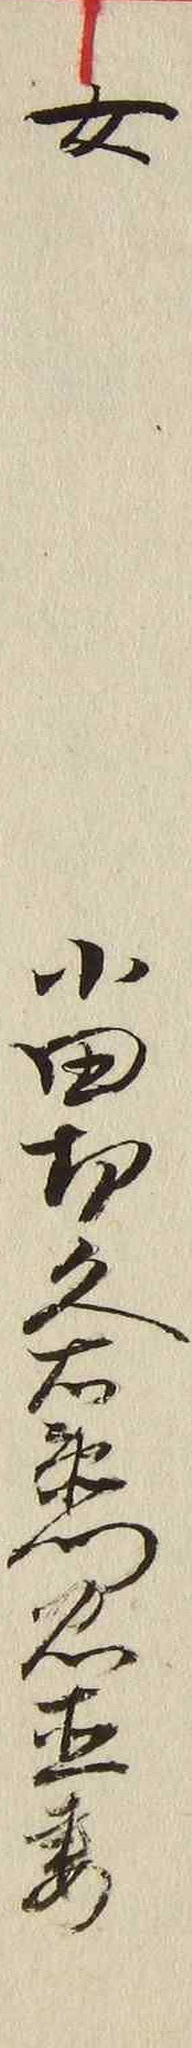女小田切久右衛門忠直妻
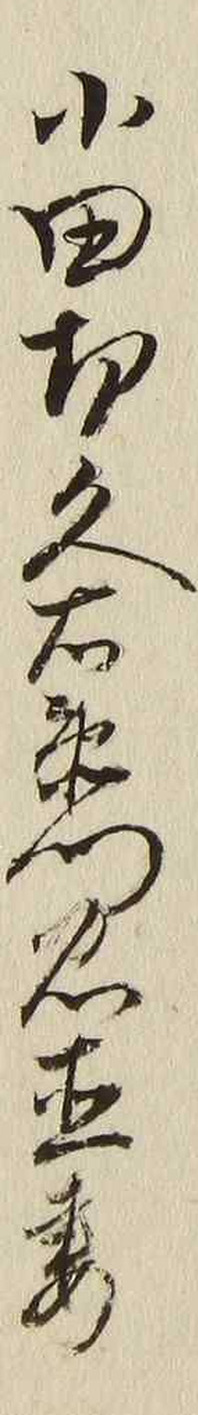女小田切久右衛門忠直妻
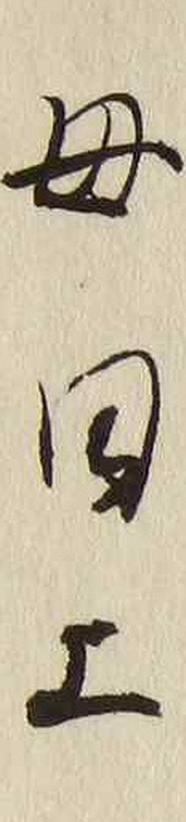母同上

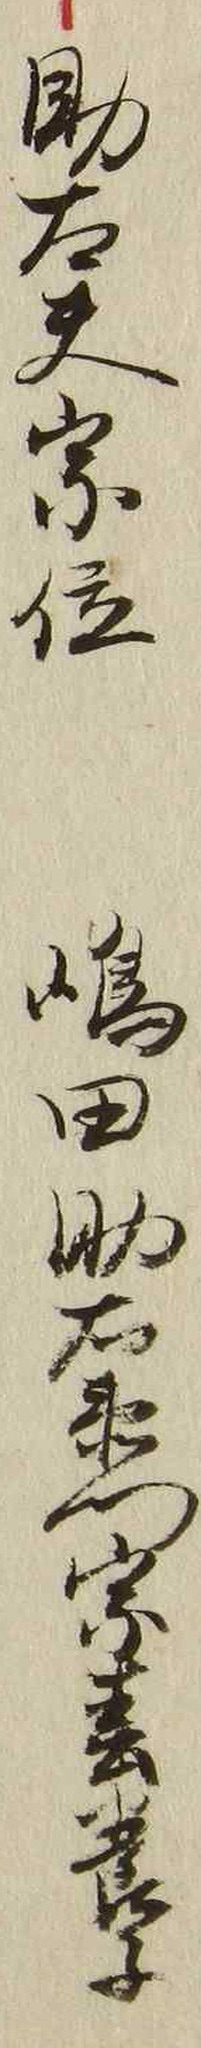助太夫宗位島田助右衛門宗春養子
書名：諸士系譜　巻之348　も之部4
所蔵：会津若松市立会津図書館
